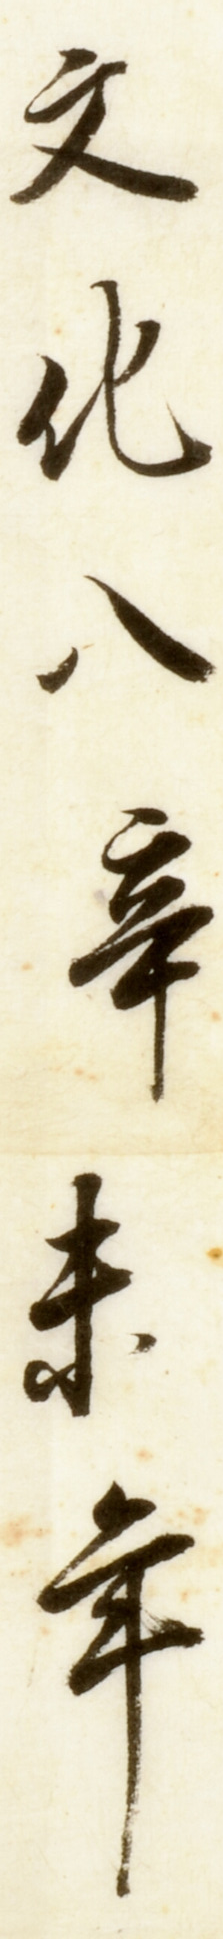文化八年辛未年
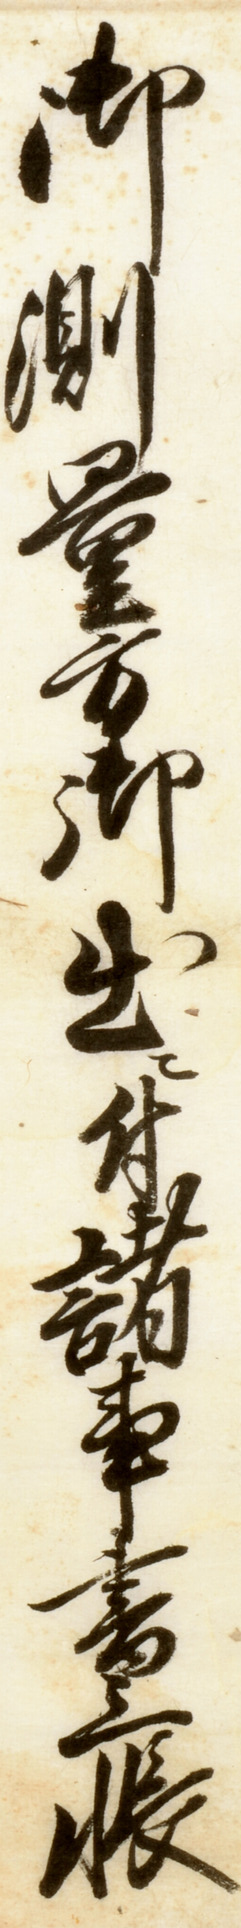御測量方御出ニ付諸事書上帳
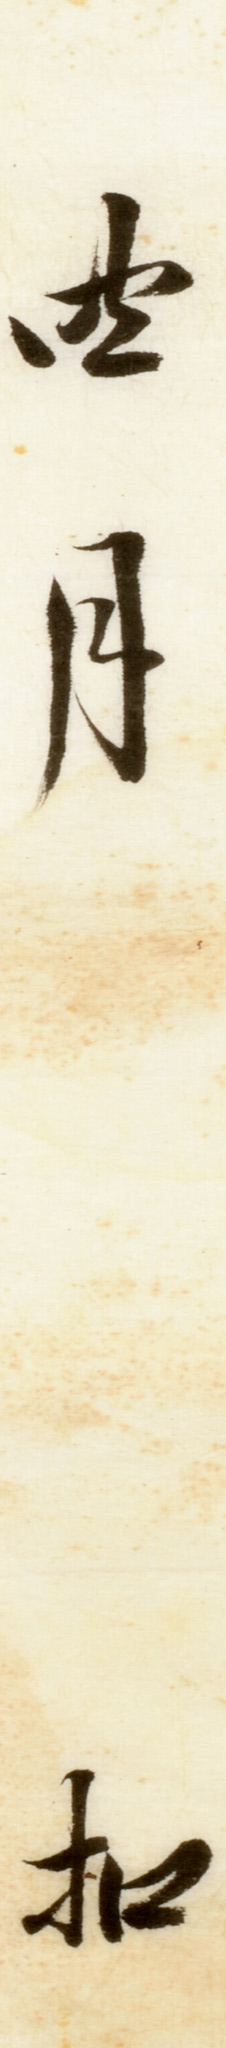四月扣

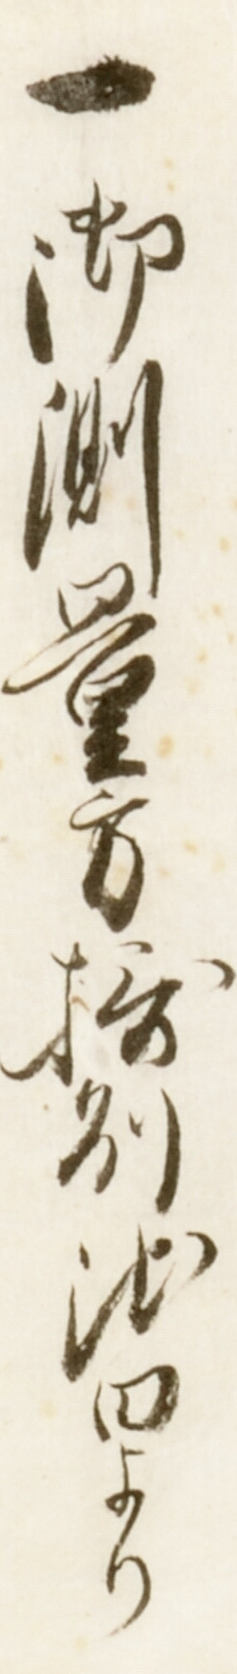御測量方播州池田より
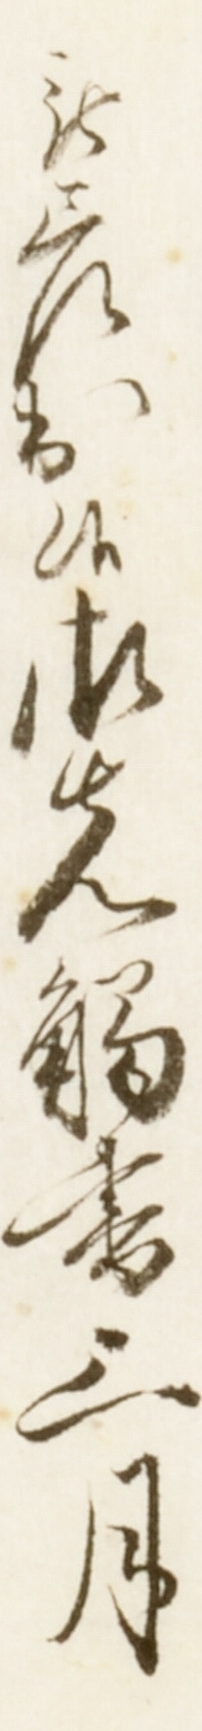被差出候御先触書三月
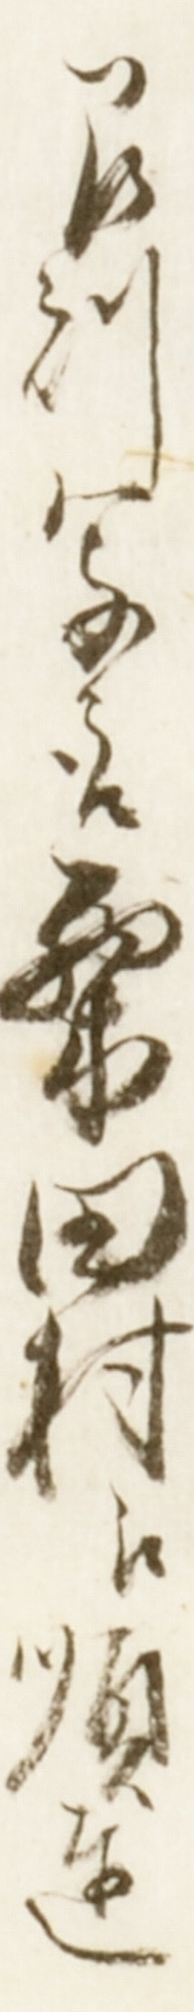即刻写被取栗田村江順達
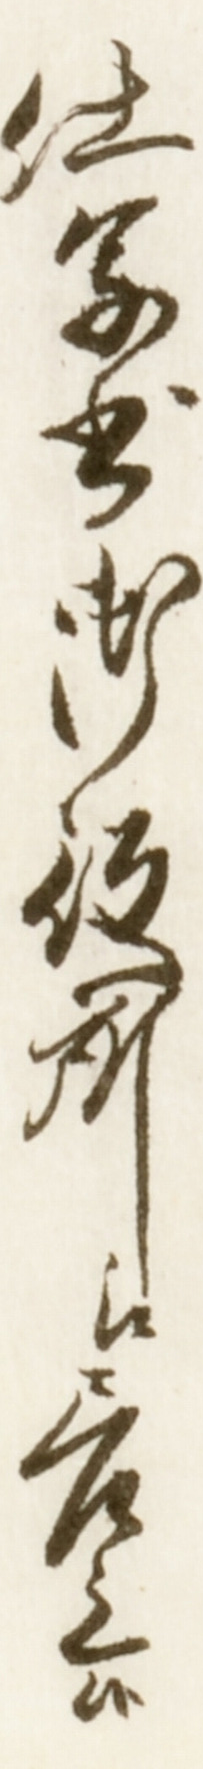仕写書御役所江差上候
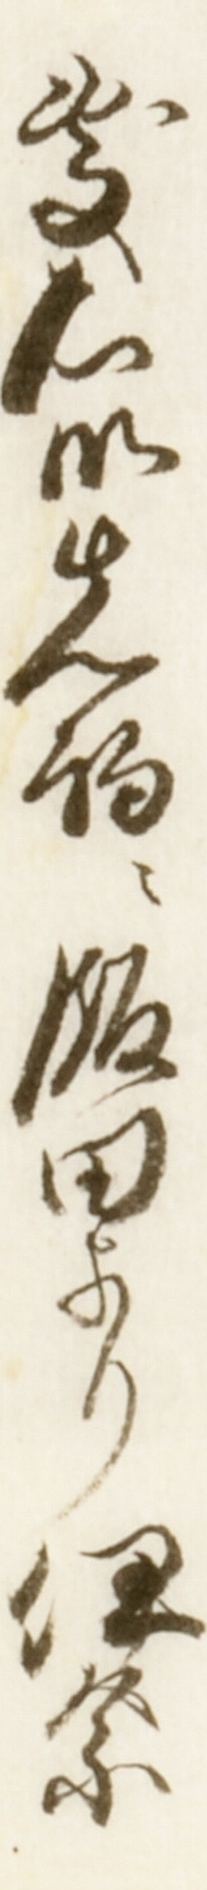處右先触ニ飯田より伊奈
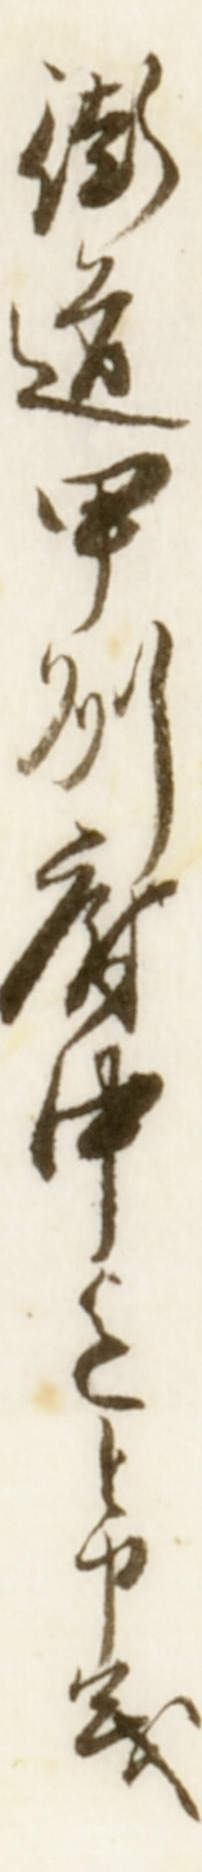街道甲州府中遣迄と申義
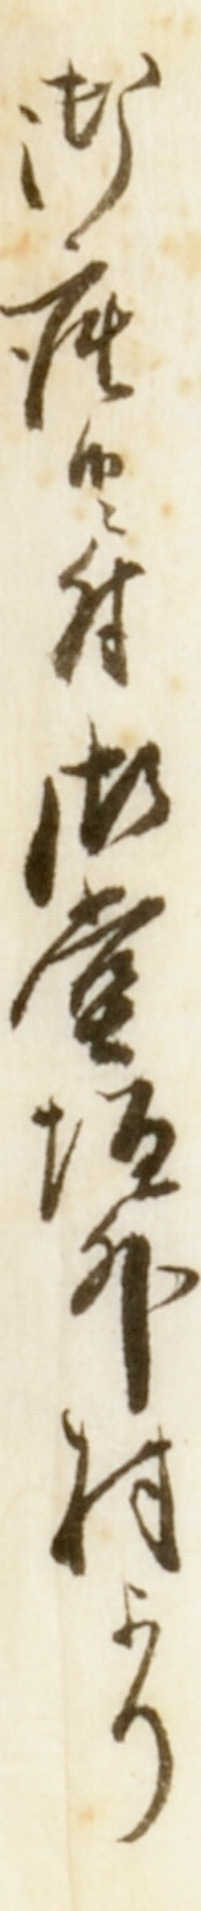御座候ニ付御堂垣外村より
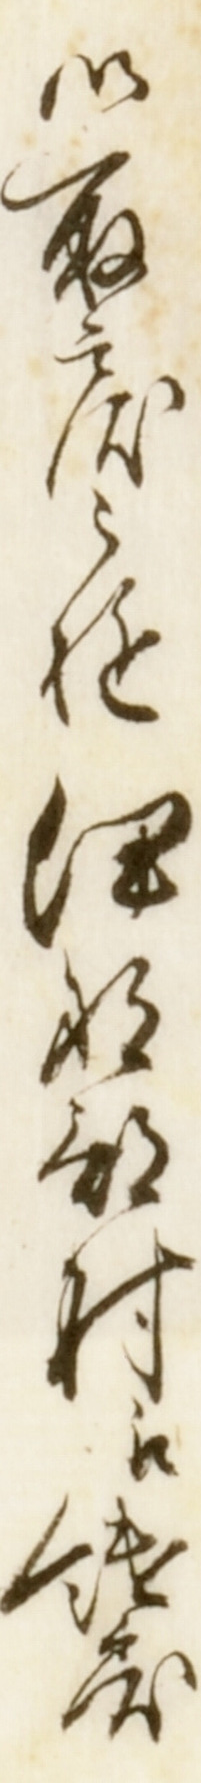御取戻被遊伊那部村江継戻
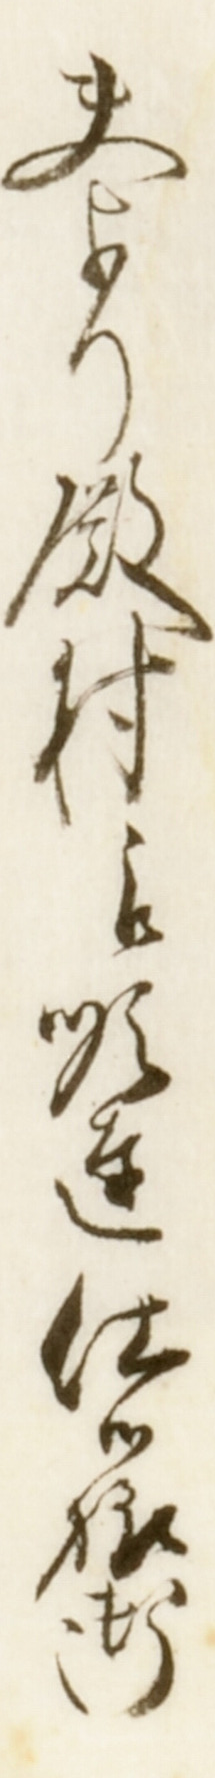夫より殿村江順達仕候様御
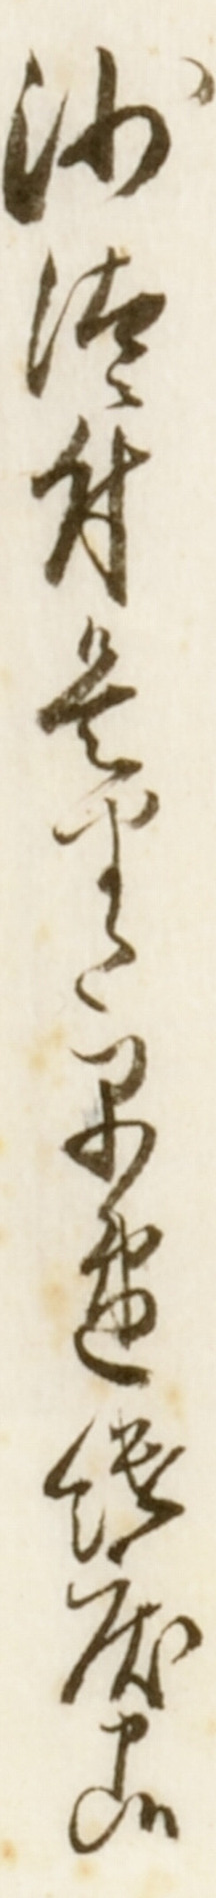沙汰ニ付是また早速継戻申候
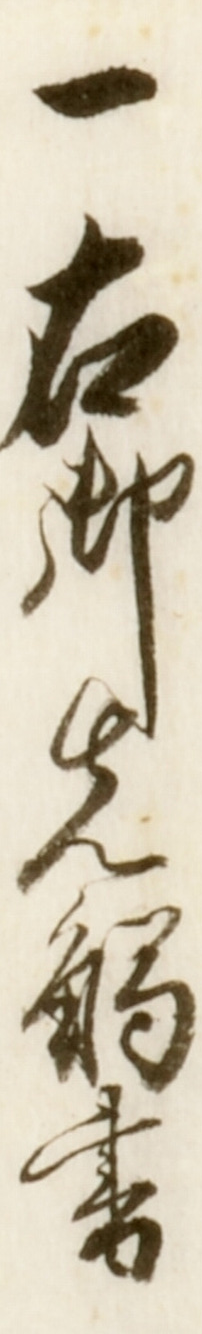右御先触書
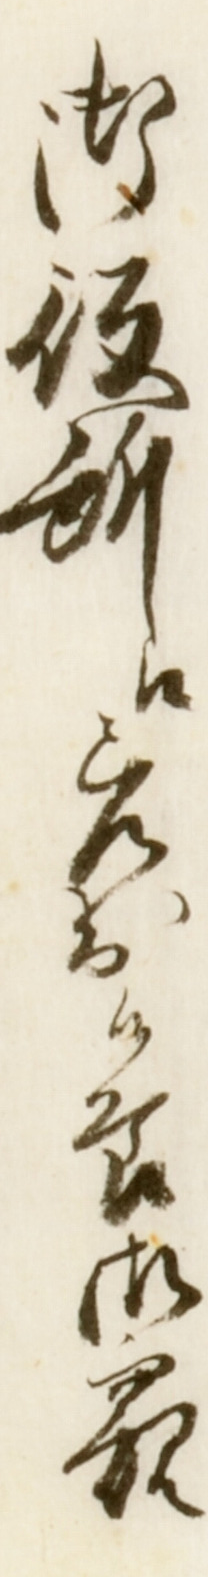御役所江差出候節御窺
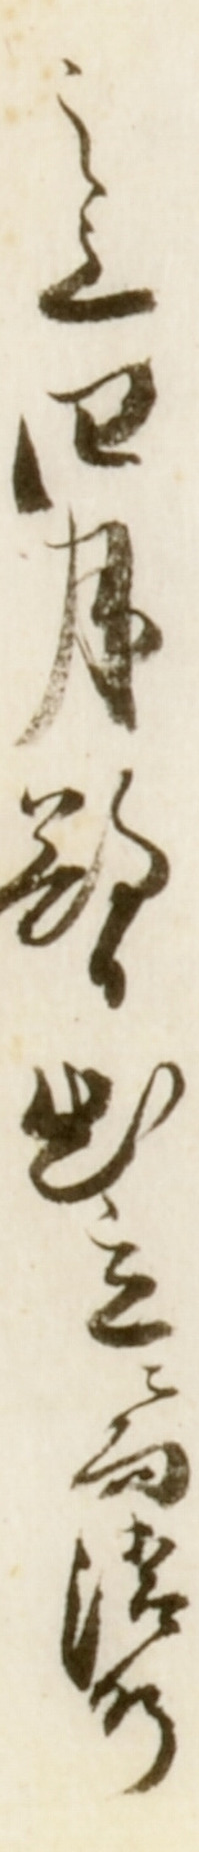之上四月朔日出立ニ而清水
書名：諸事書上
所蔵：伊那市立高遠町図書館・合同会社AMANE
